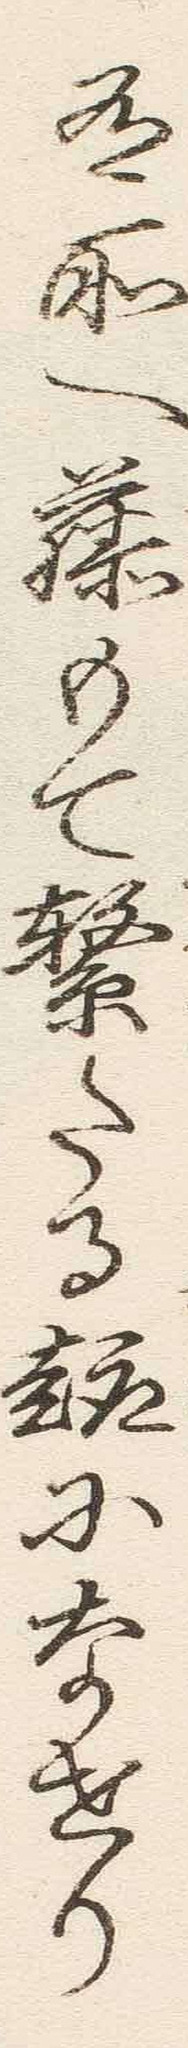有所へ藤もて繋たる趣になせり
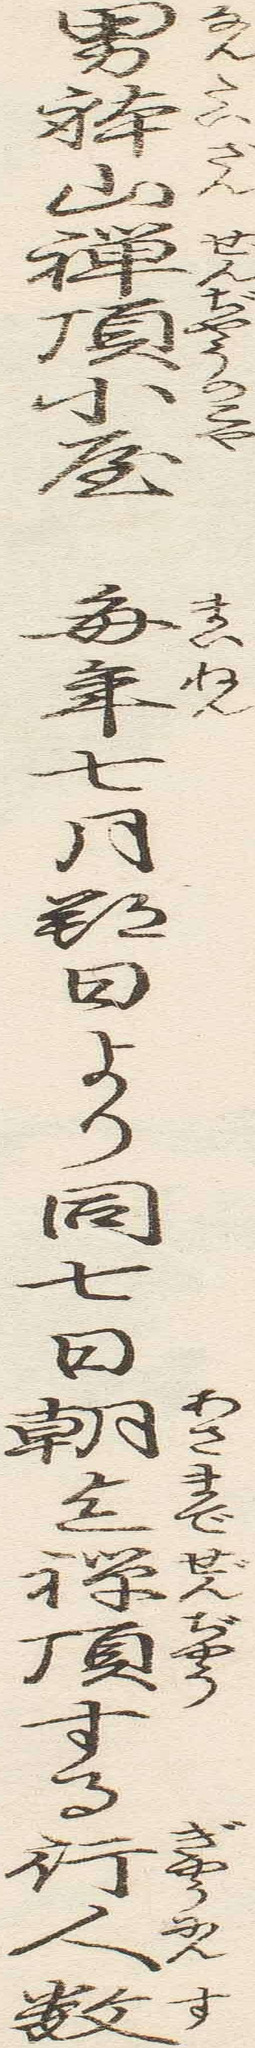男躰山禅頂小屋毎年七月朔日より同七日朝迄禅頂する行人数
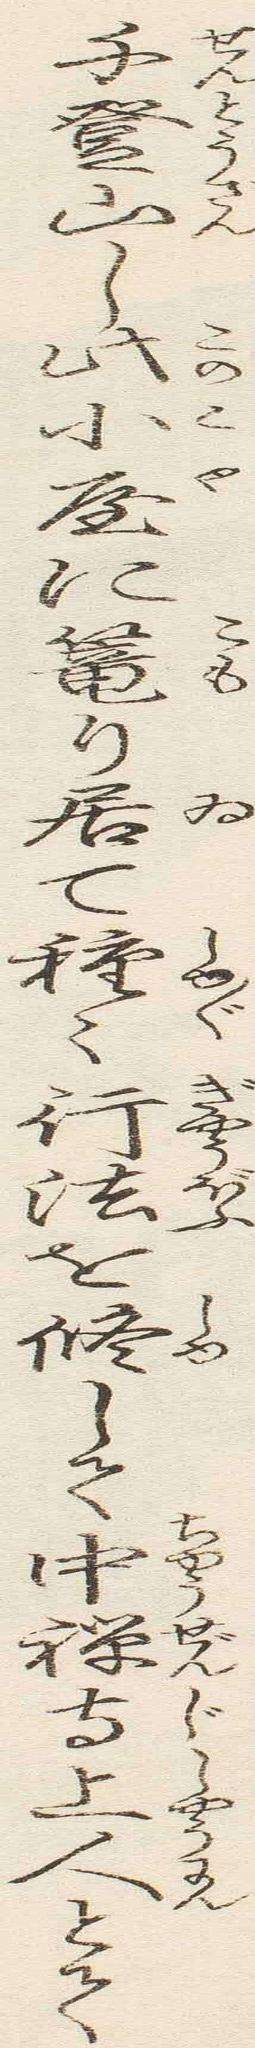千登山し此小屋に篭り居て種〻行法を修して中禅寺上人とて
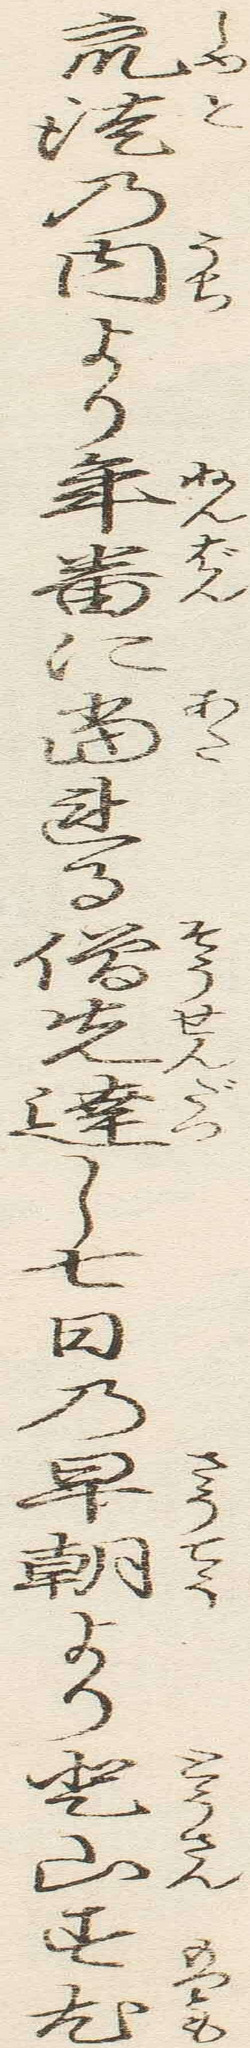衆徒の内より年番に當れる僧先達し七日の早朝より登山す尤
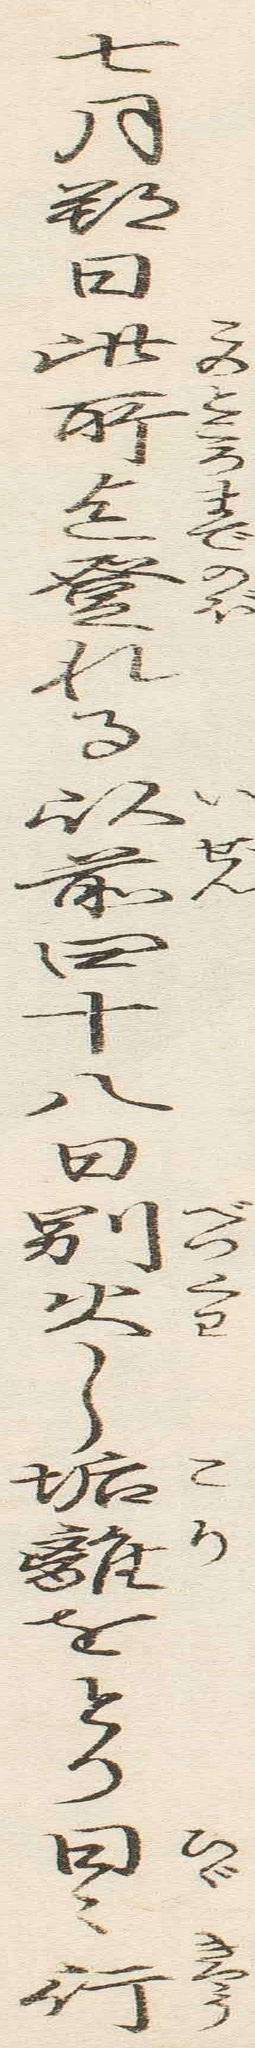七月朔日此所迄登れる以前四十八日別火し垢離をとり日〻行
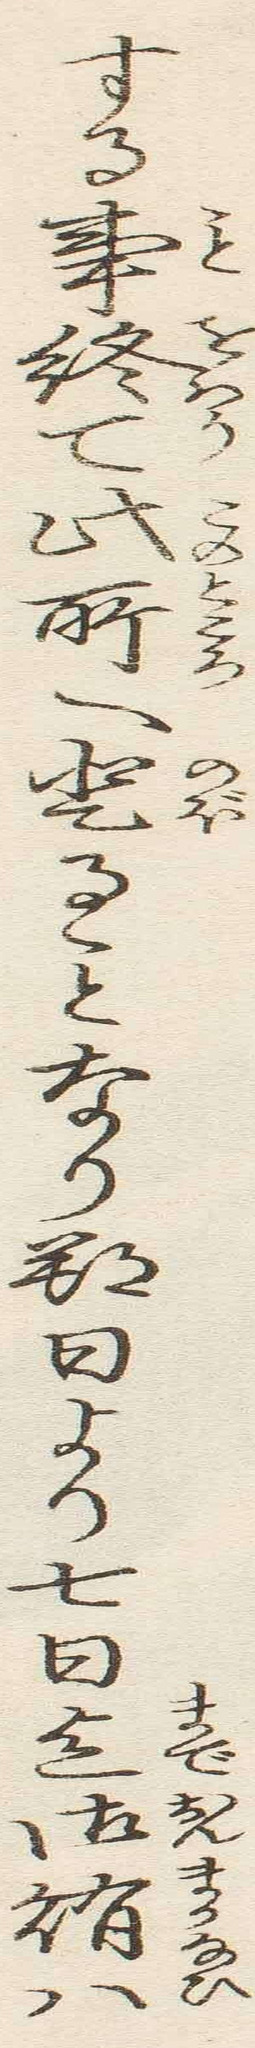する事終て此所へ登ることなり朔日より七日迄御賄は
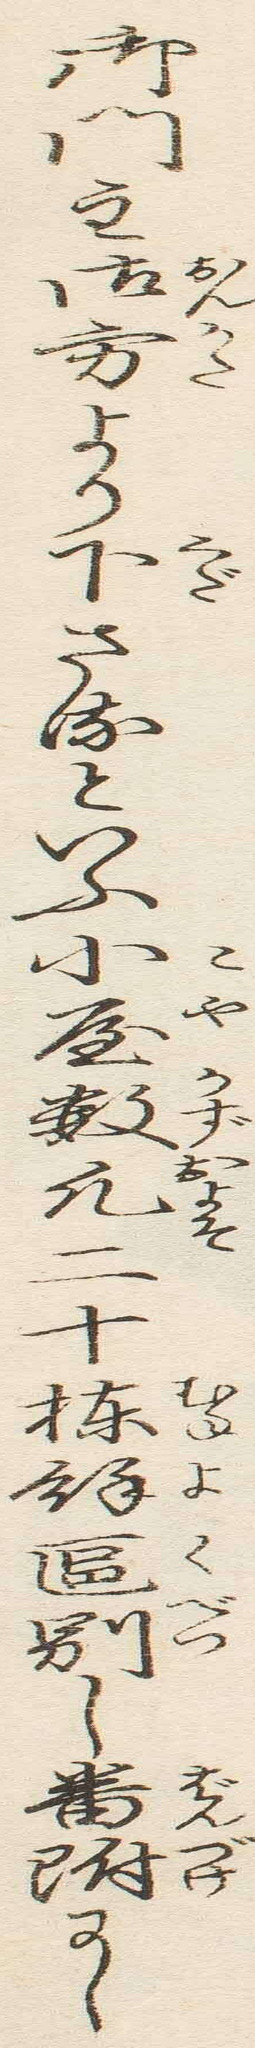御門主御方より下さるといふ小屋数凢二十棟餘區別し番附にし
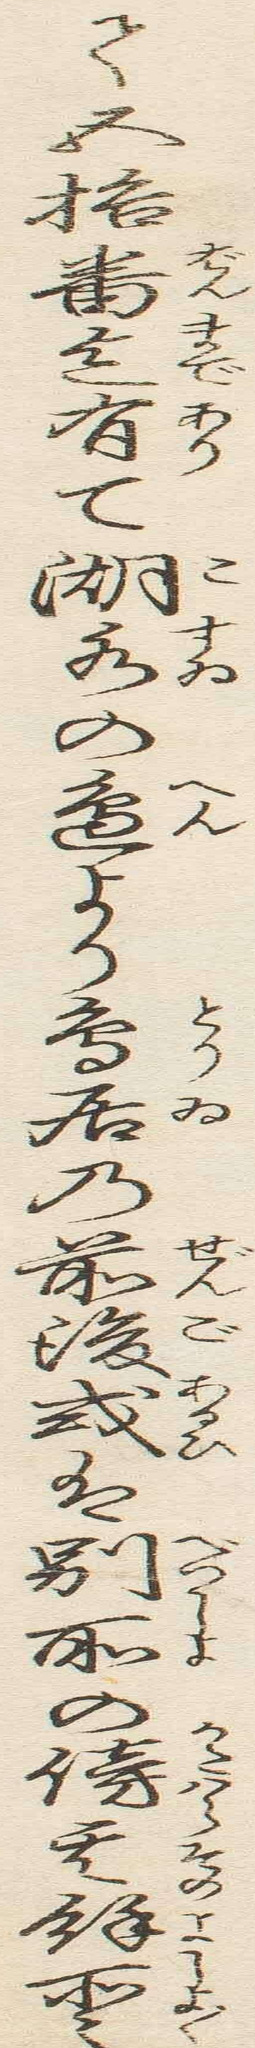て五拾番迄有て湖水の邊より鳥居の前後或は別所の傍其餘所〻
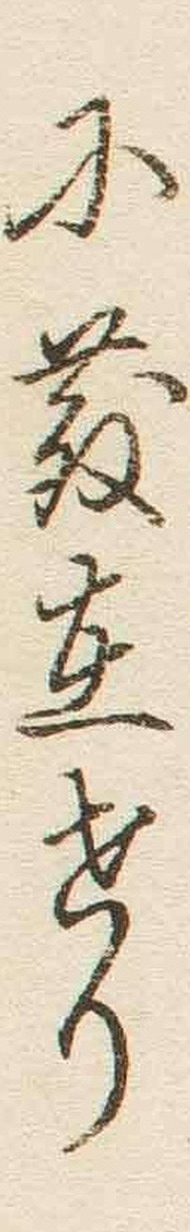に散在せり
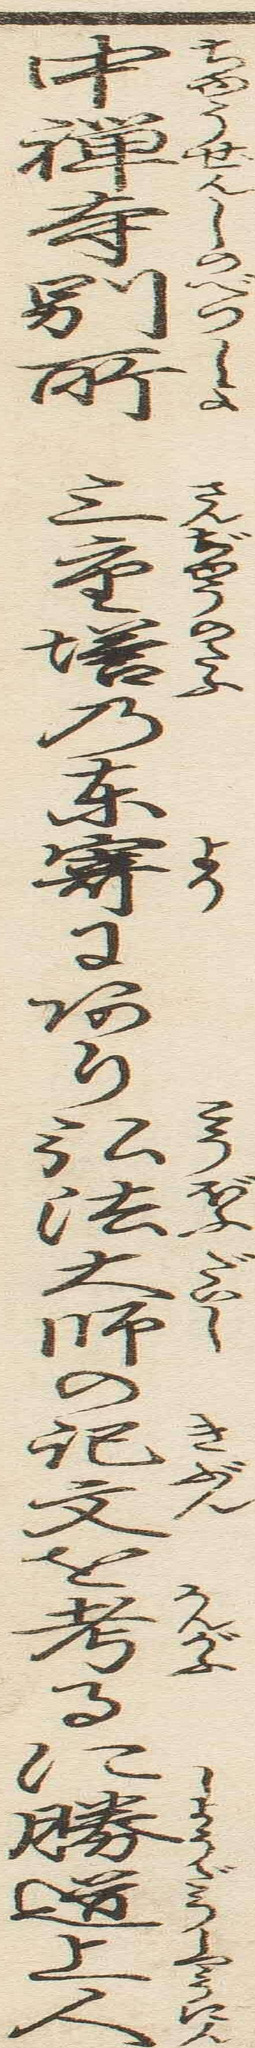中禅寺別所三重塔の東寄にあり弘法大師の記文を考るに勝道上人

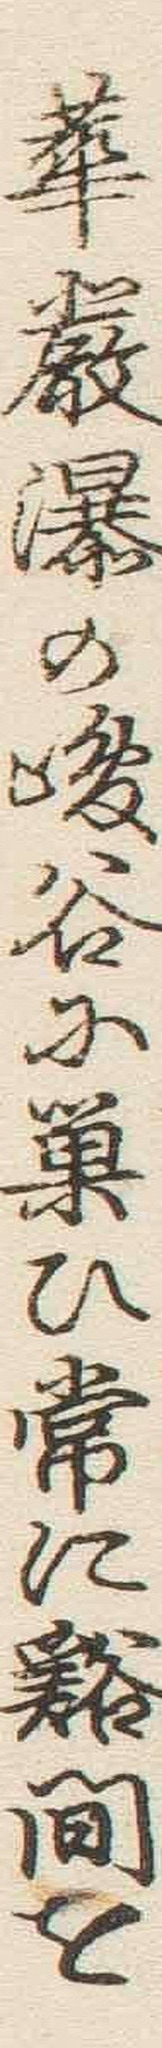蕐嚴瀑の峻谷に巣ひ常に谿間を
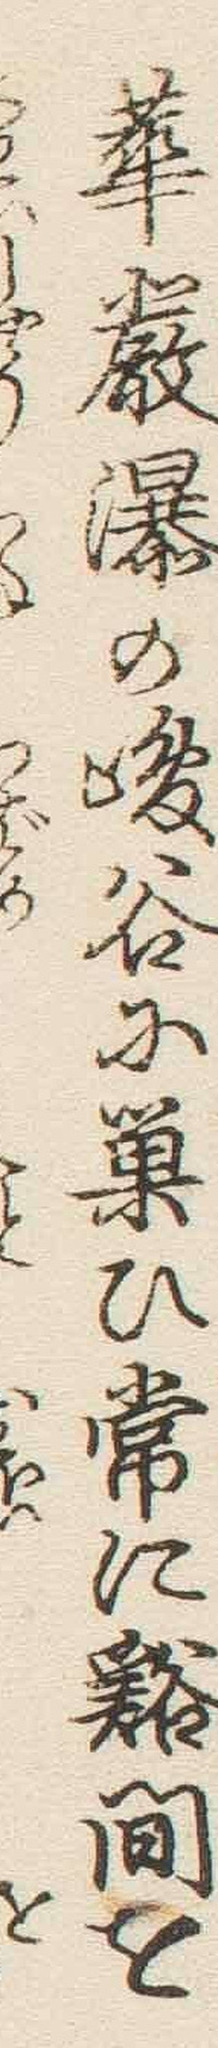蕐嚴瀑の峻谷に巣ひ常に谿間を
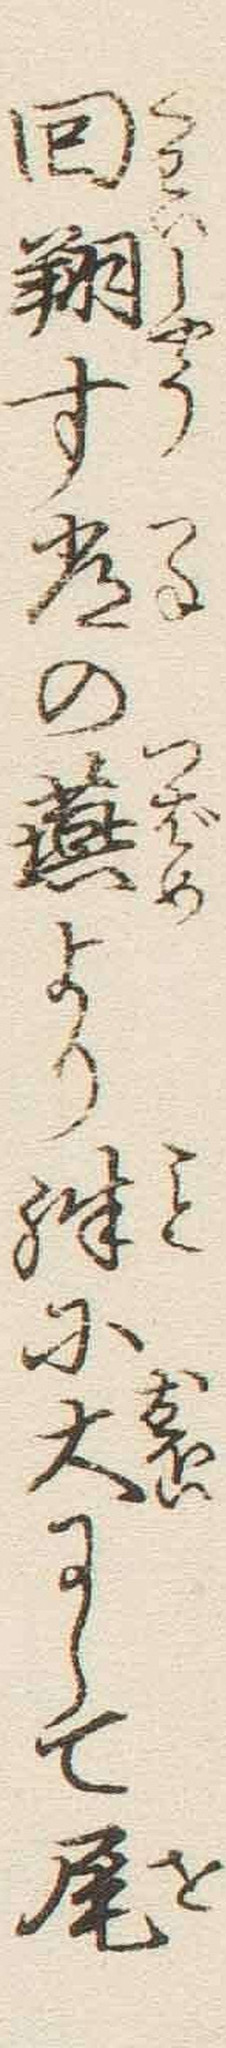囘翔す常の燕より殊に大にして尾
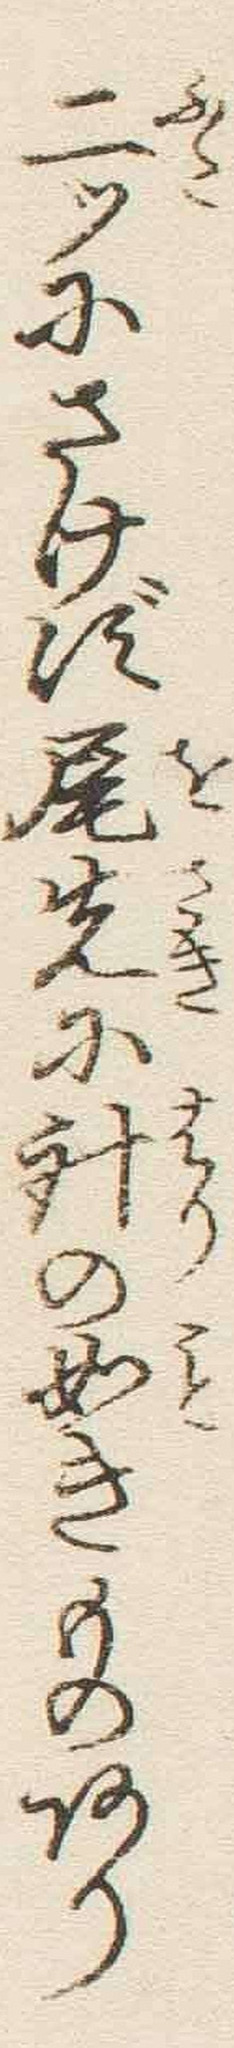二ッにさけず尾先に針の如きものあり
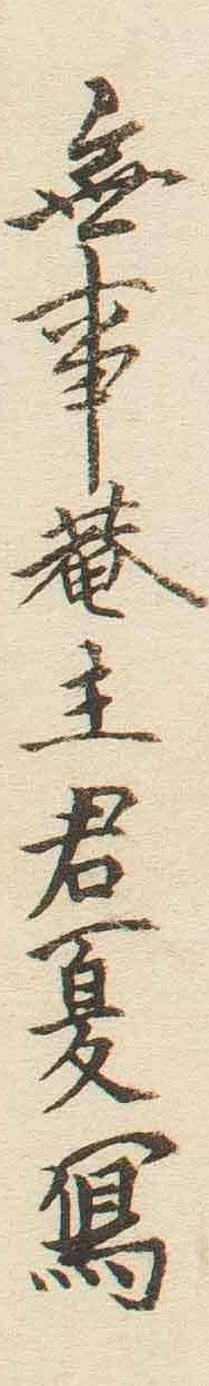無事菴主君夏冩

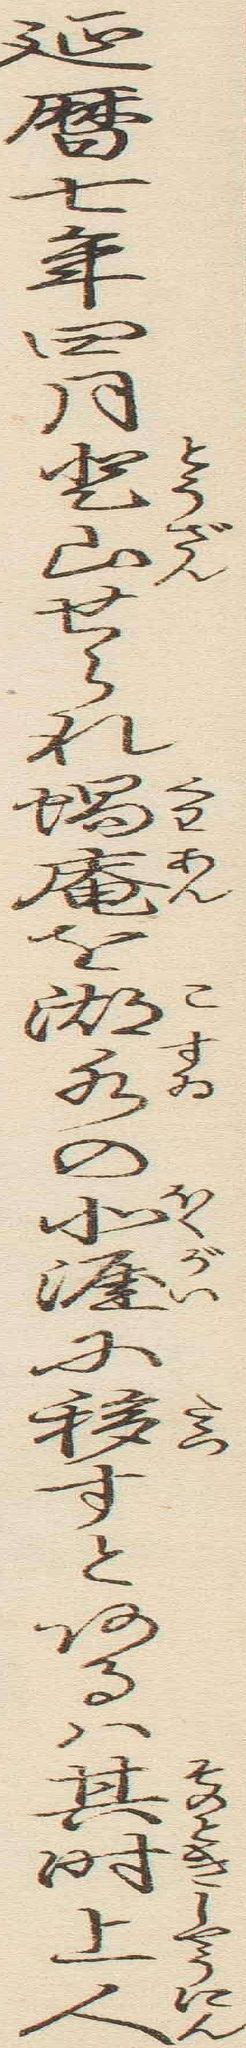延暦七年四月登山せられ蝸庵を湖水の北涯に移すとあるは其时上人
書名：日光山志
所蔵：東京学芸大学附属図書館 国文学研究資料館
